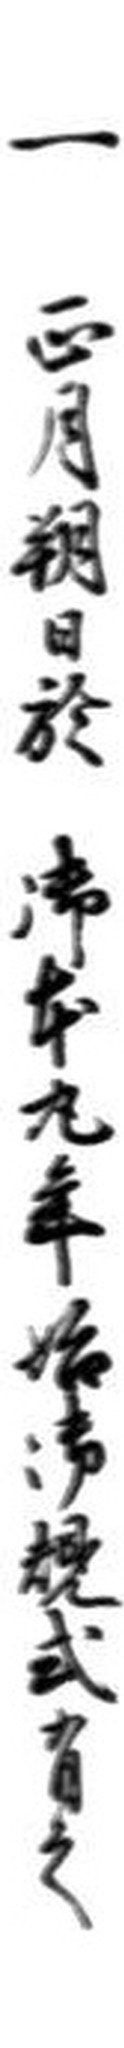一正月朔日於御本丸年始御規式有之
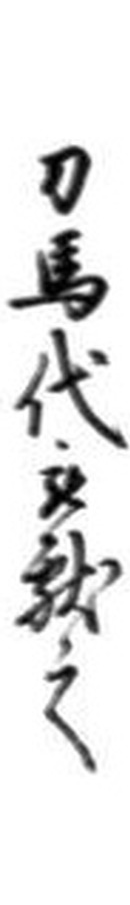刀馬代被献之
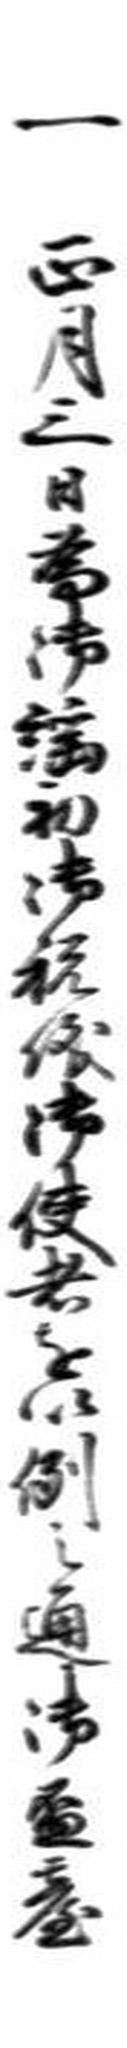一正月三日為御謡初御祝儀御使者を以例之通御盃台
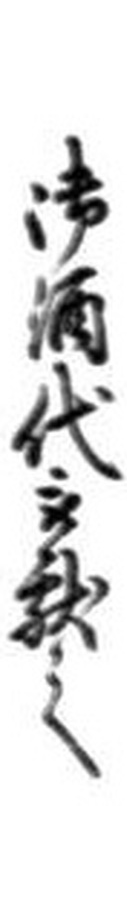御酒代被献之
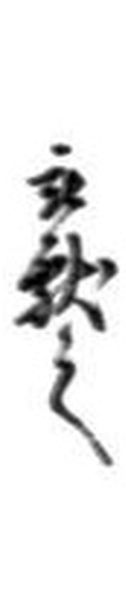被献之

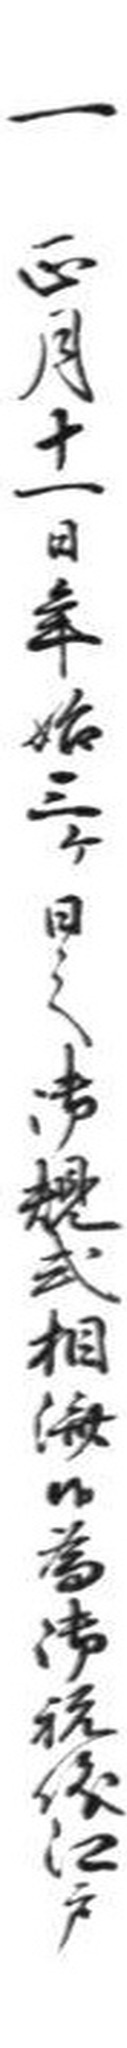一正月十一日年始三ケ日之御規式相済候為御祝儀江戸
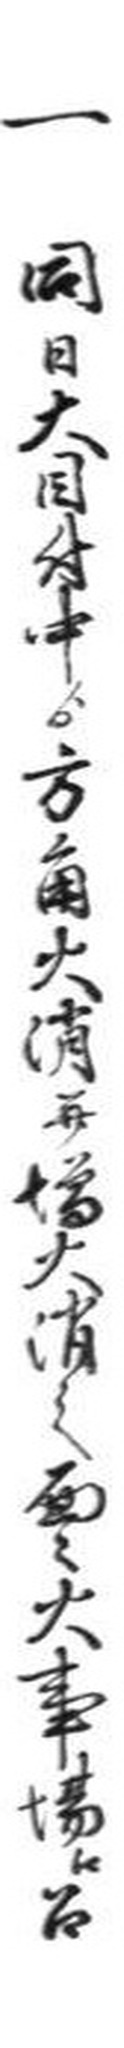一同日大目付中ゟ方角火消并増火消之面々火事場江召
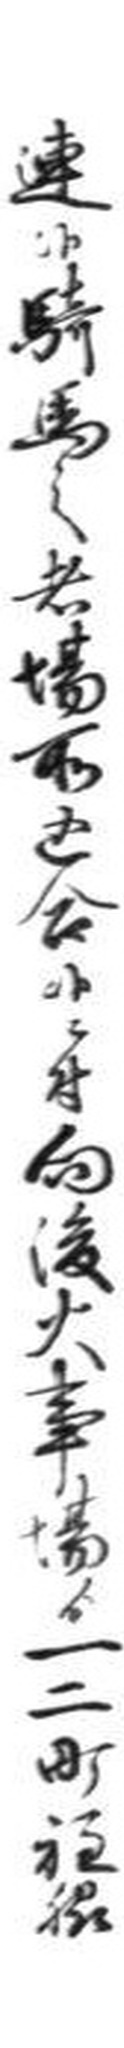連候騎馬之者場所込合候ニ付向後火事場ゟ一二町程脇
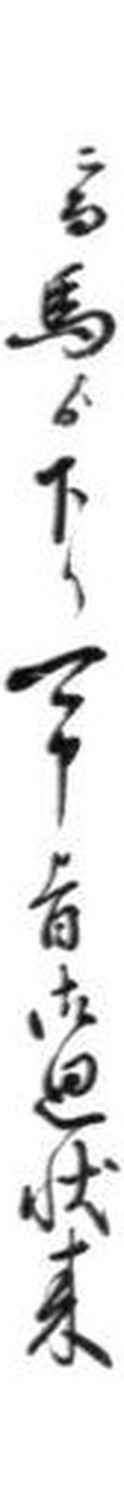ニ而馬ゟ下り可申旨御廻状来
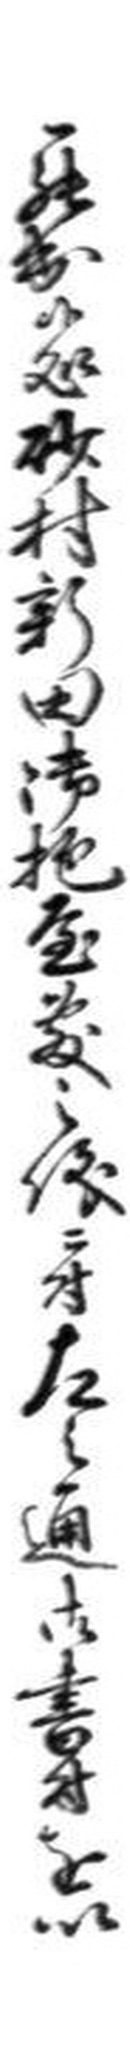罷出候処砂村新田御抱屋敷之儀ニ付左之通御書付を以
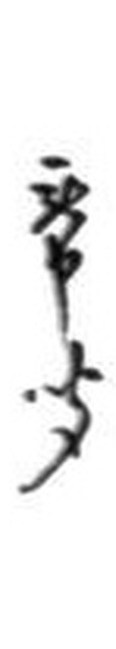被申聞
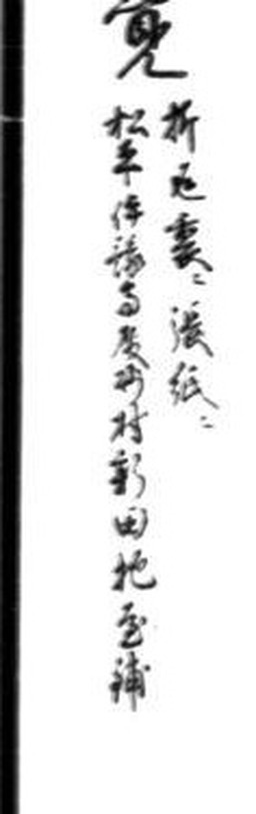松平伊予守殿砂村新田抱屋鋪
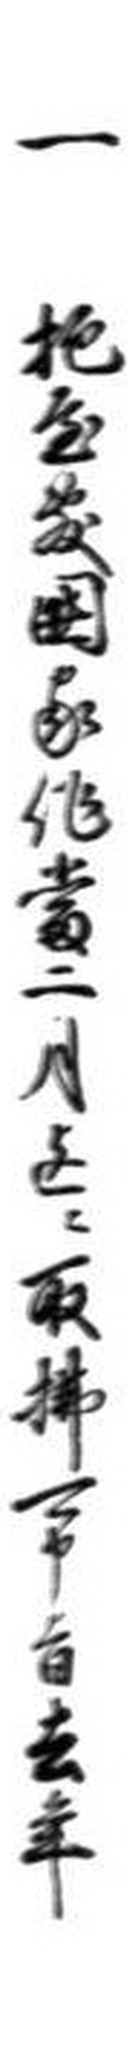一抱屋敷囲家作当二月迄ニ取払可申旨去年
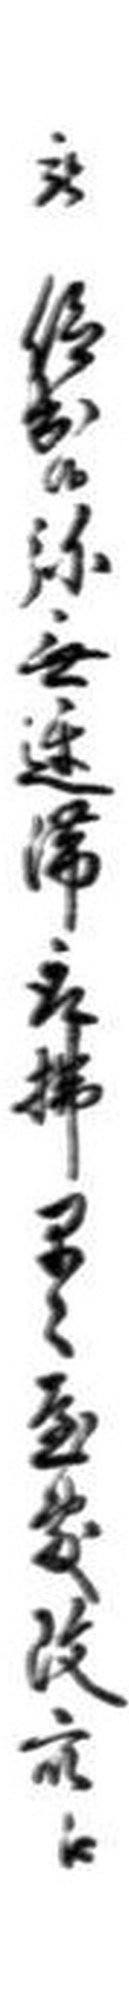被仰出候弥無遅滞取払早々屋敷改衆江
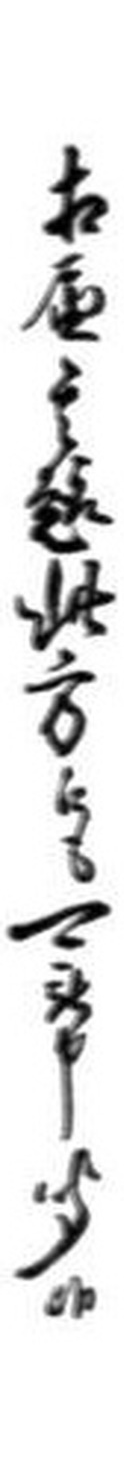相届其趣此方江も可被申聞候
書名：家譜 三十二 吉邦公 従享保二年到享保三年
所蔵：福井県文書館 Fukui Prefectural Archives
